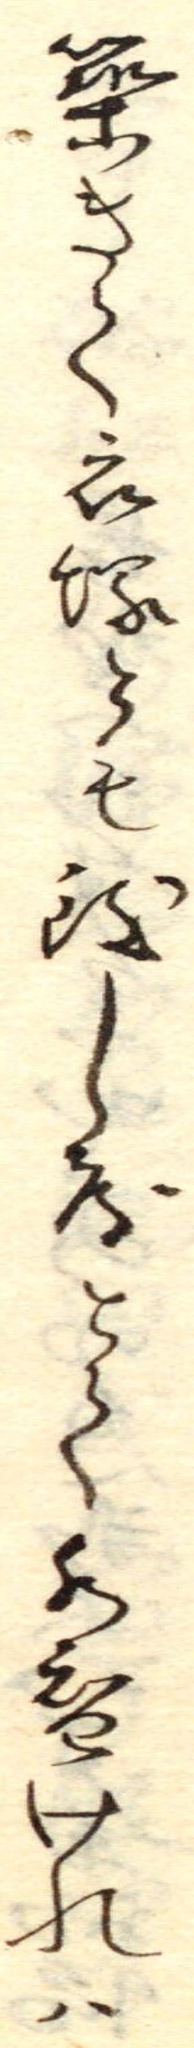築きて衣塚とも致し度とて水替けれは
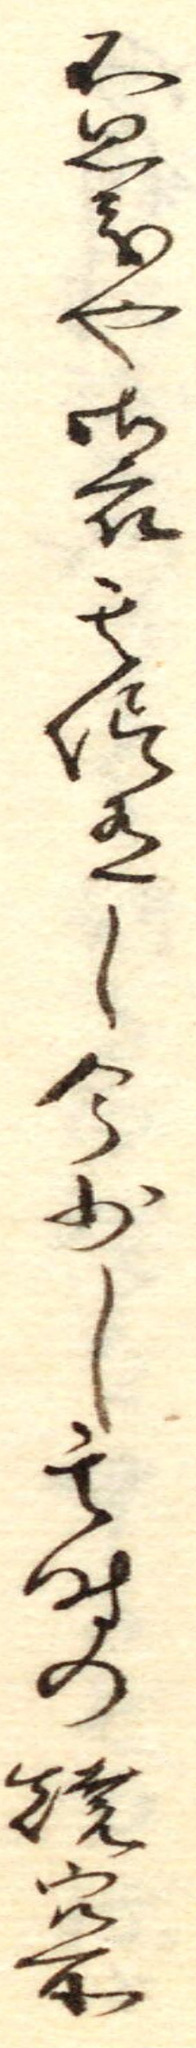不思義や御衣其侭有し今少し其時の焼穴所
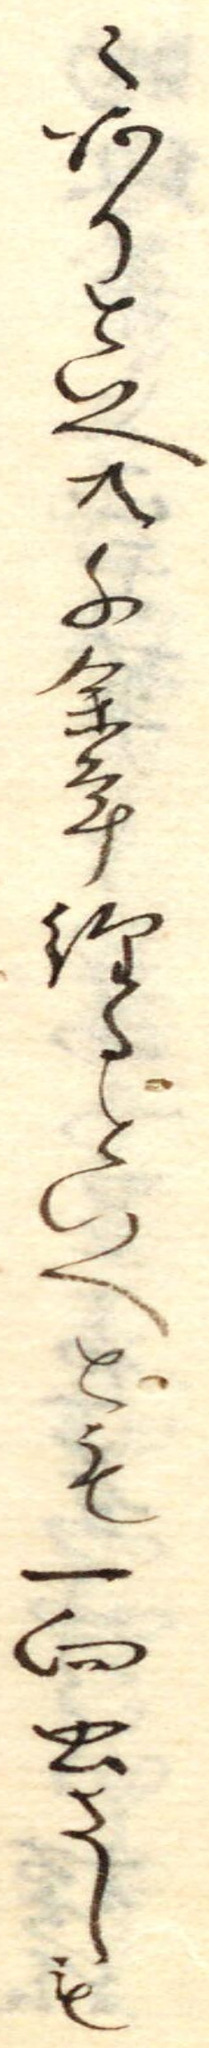々ありといへ共千余年経るといへとも一向虫さしも
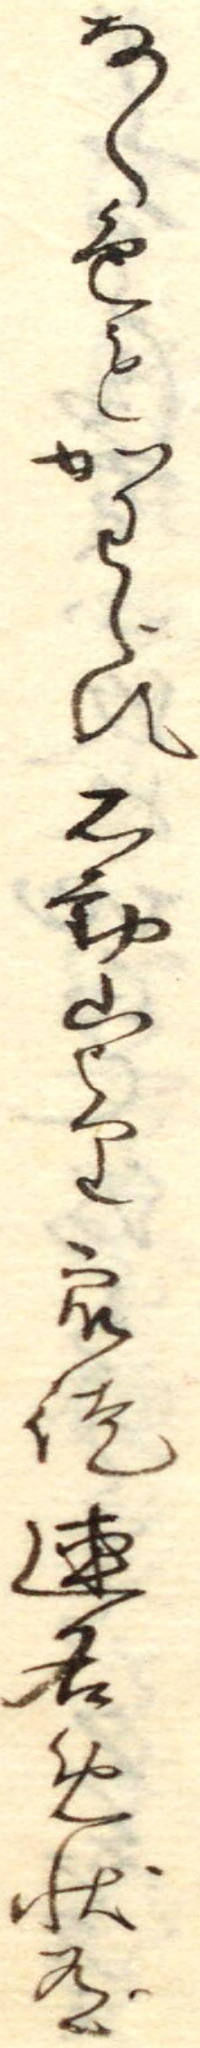なく色もかわらす石動山より衆徒連名免状有
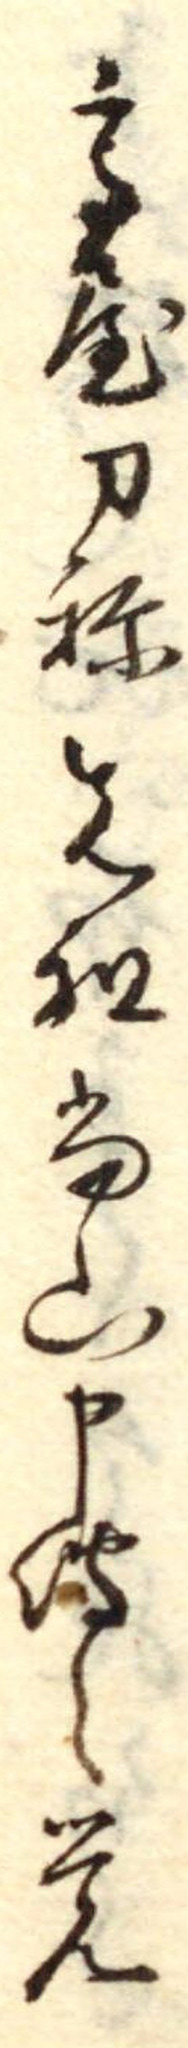高屋刀祢先祖当山申伝し覚
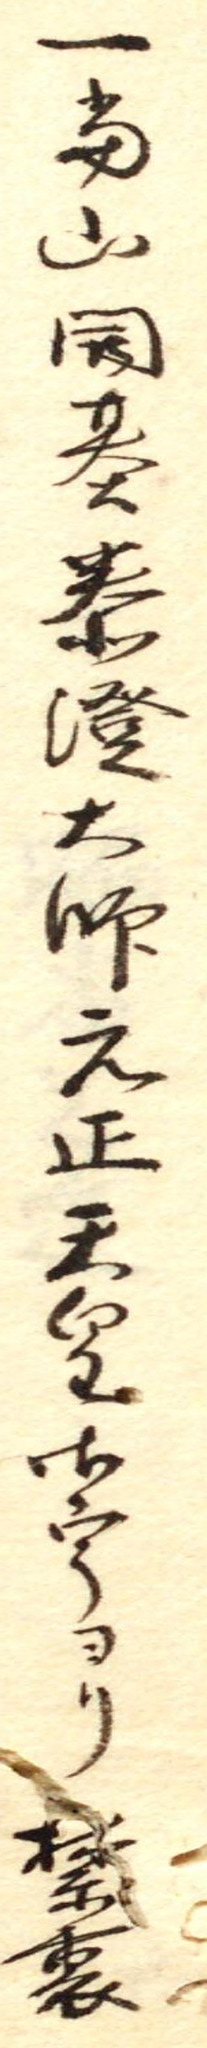一当山開基泰澄大師元正天皇御宇より禁裏
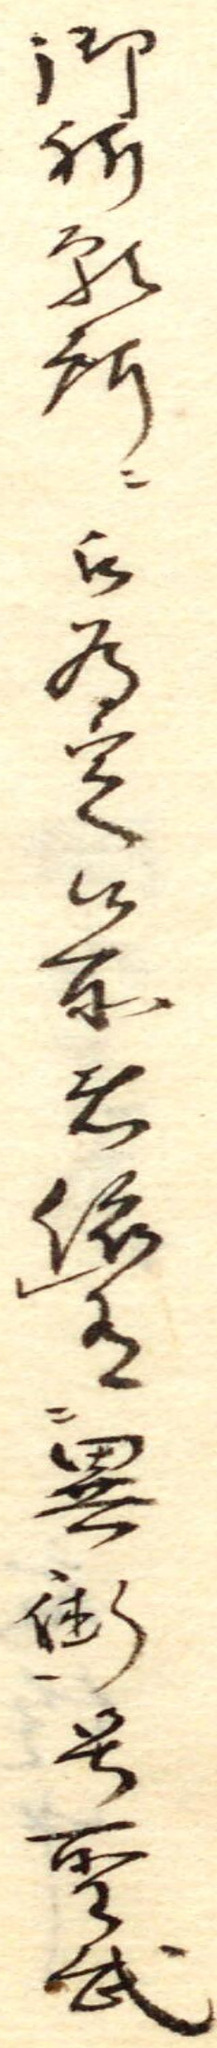御祈願所に被為定候所依有異術号聖武
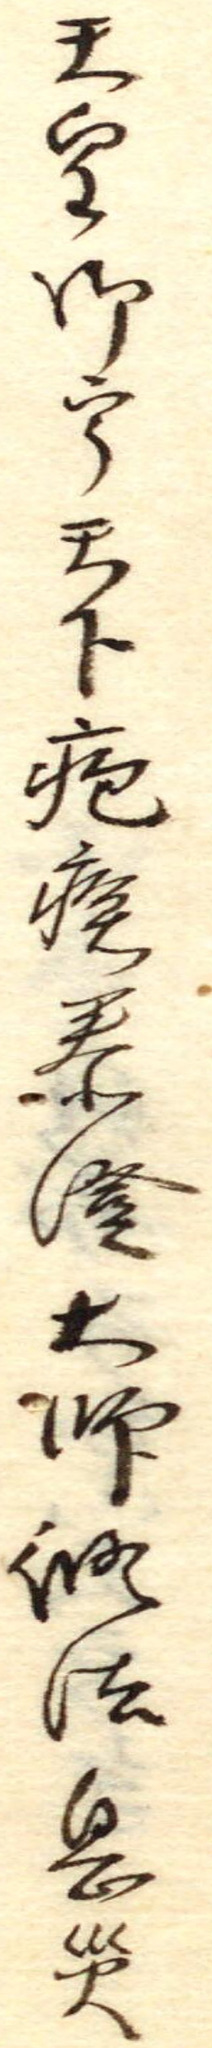天皇御宇天下疱瘡泰澄大師修法息災
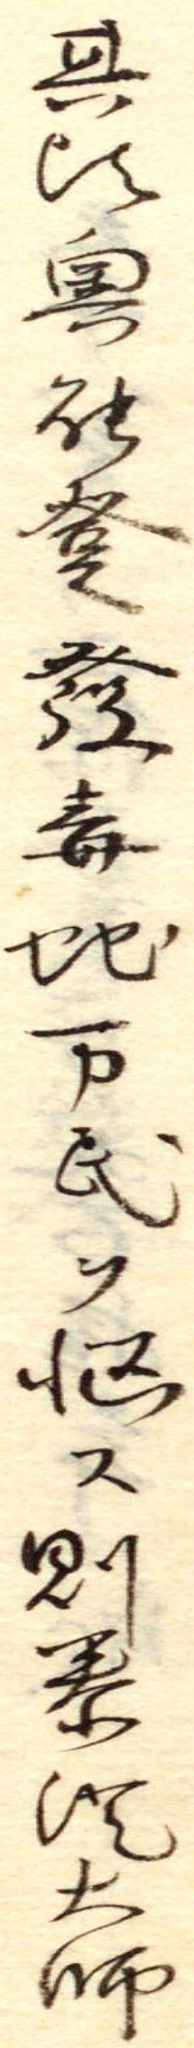其頃奥能登発毒地万民を悩す則泰澄大師
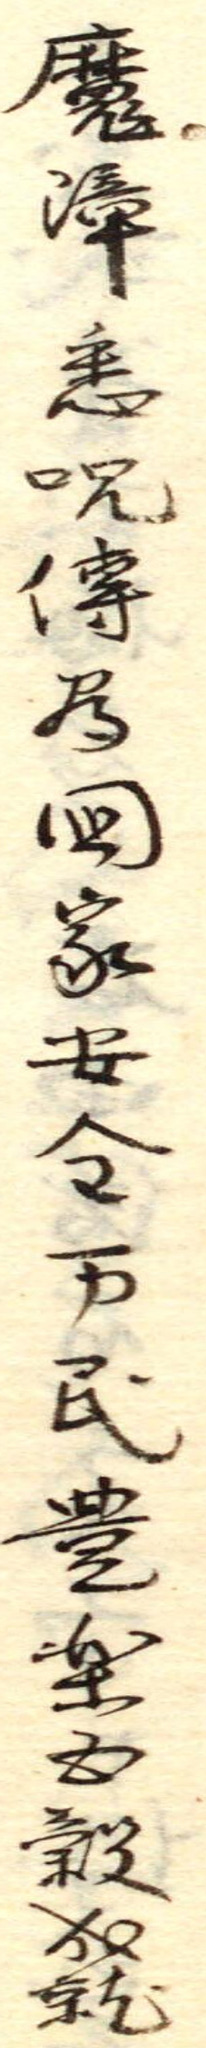魔障悉呪伝為国家安全万民豊楽五穀成就
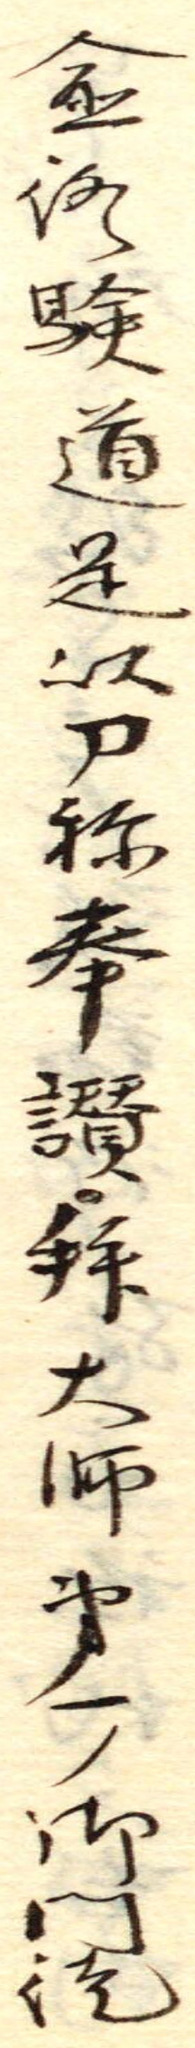愈修験道足以刀祢奉賛拝大師第一ノ御門徒
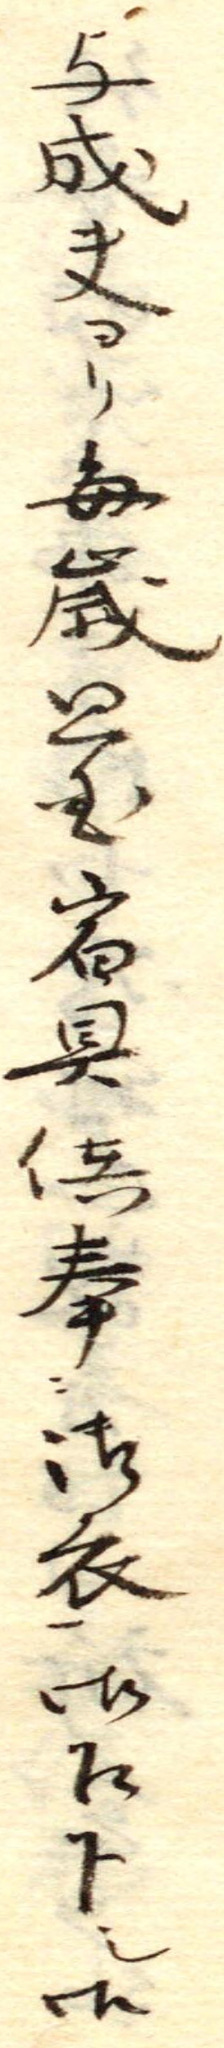与成夫より毎歳廻国宿具供奉御衣御召下し御
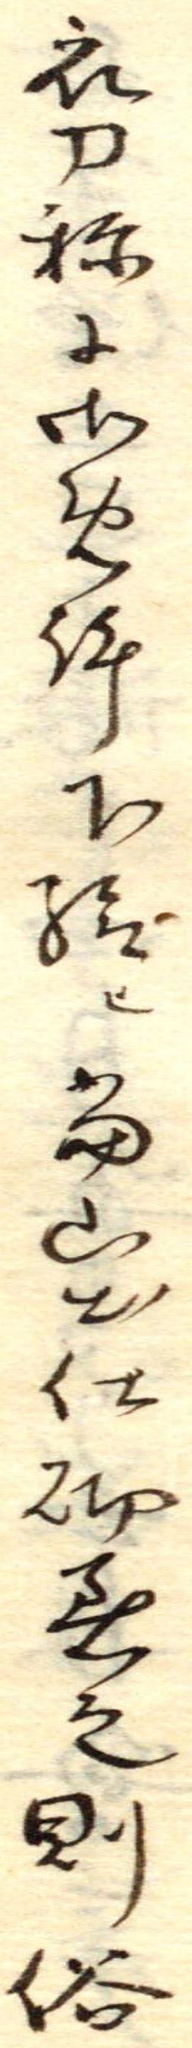衣刀祢に御免許下給ひ当山出仕砌着之則俗
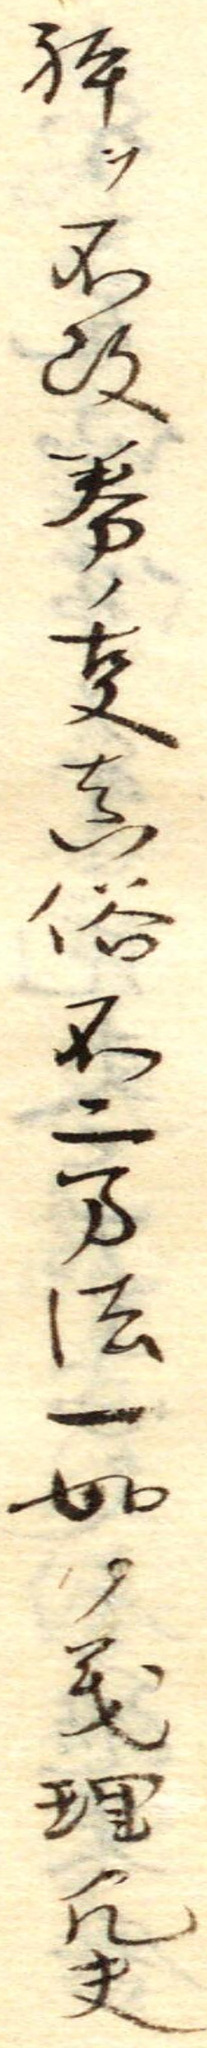躰を不改券ノ事し真俗不二万法一如ノ義理凡夫

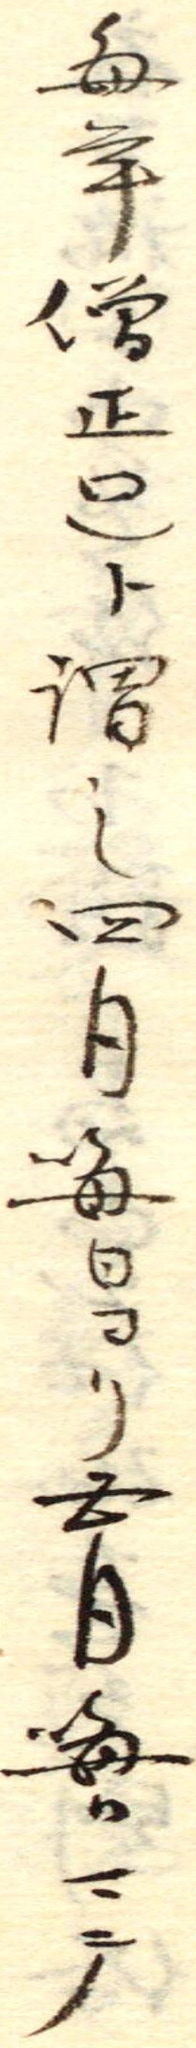毎年僧正廻と謂之四月晦日より五月晦日まて
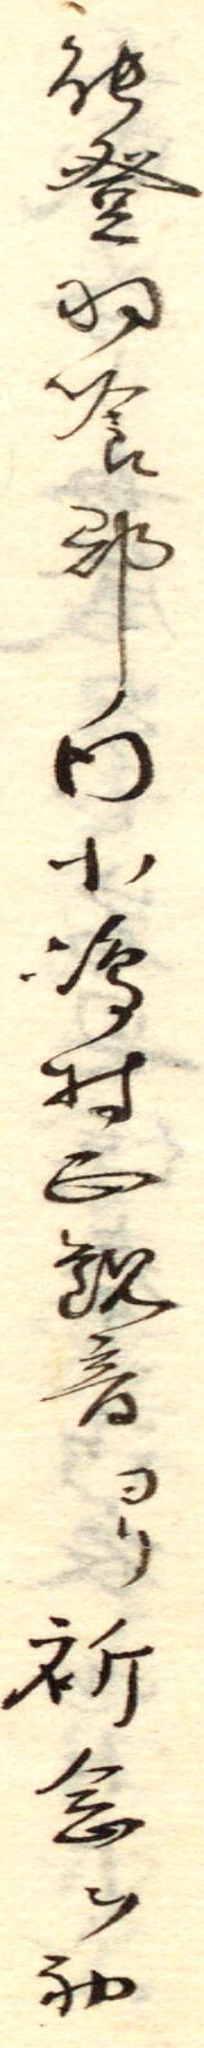能登羽喰郡ノ内小嶋村正観音より祈念を初
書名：能登名跡誌
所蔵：Ishikawa Prefectural Library
